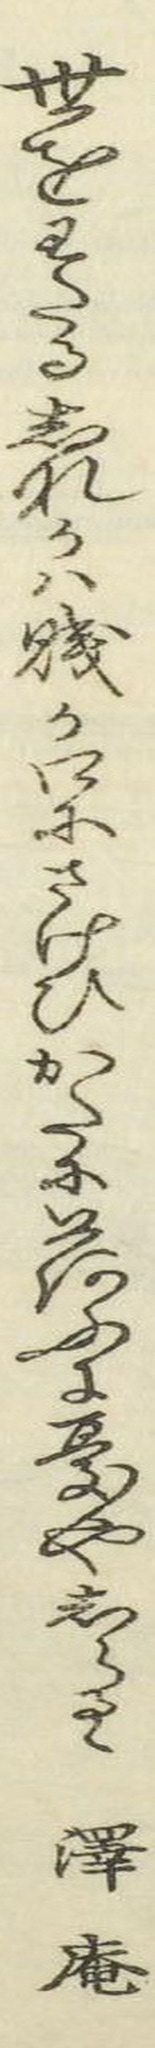世をわたるしなかは賤か口にさけひかたに荷ふに憂やしらるゝ澤庵
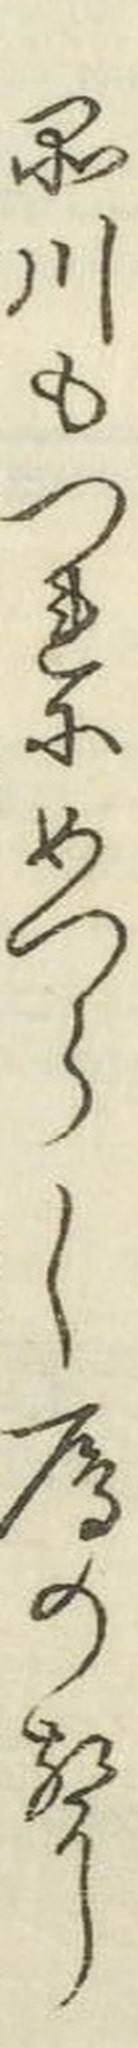品川もつれにめつらし鳫の聲其角
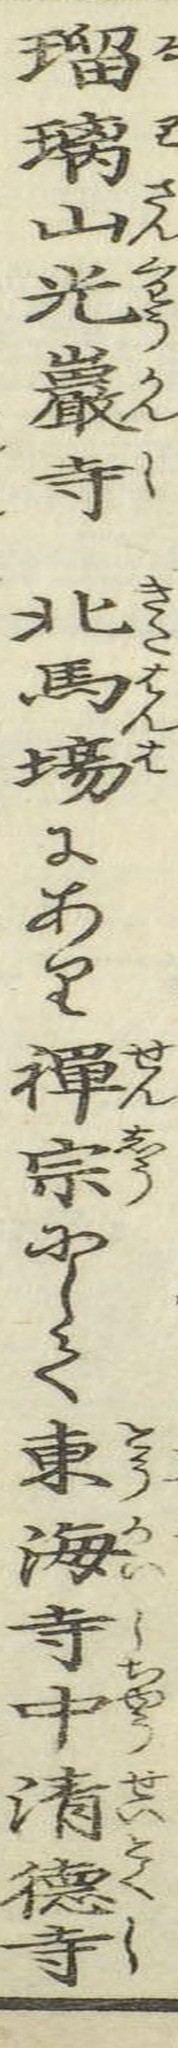瑠璃山光巖寺北馬塲にあり禪宗にして東海寺中清德寺
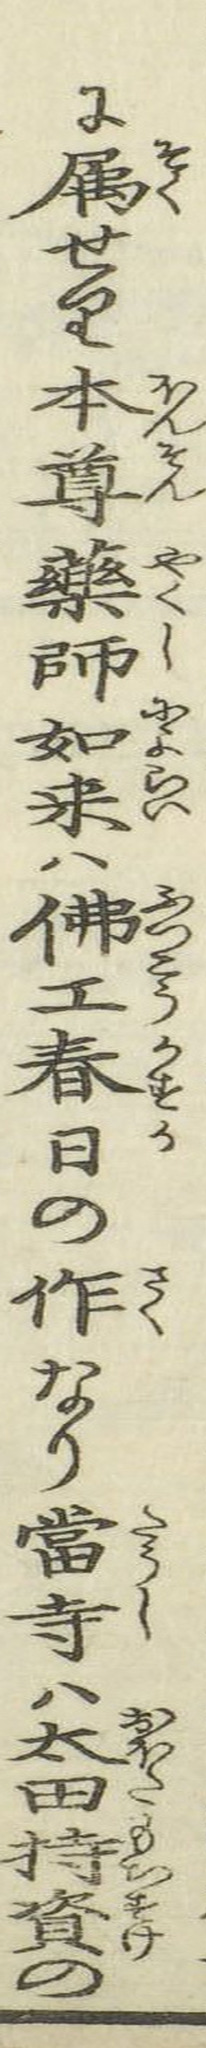に属せり本尊藥師如来は佛工春日の作なり當寺は太田持資の
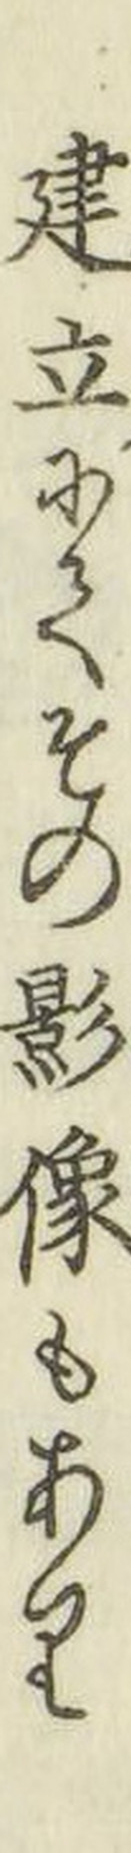建立にてその影像もあり
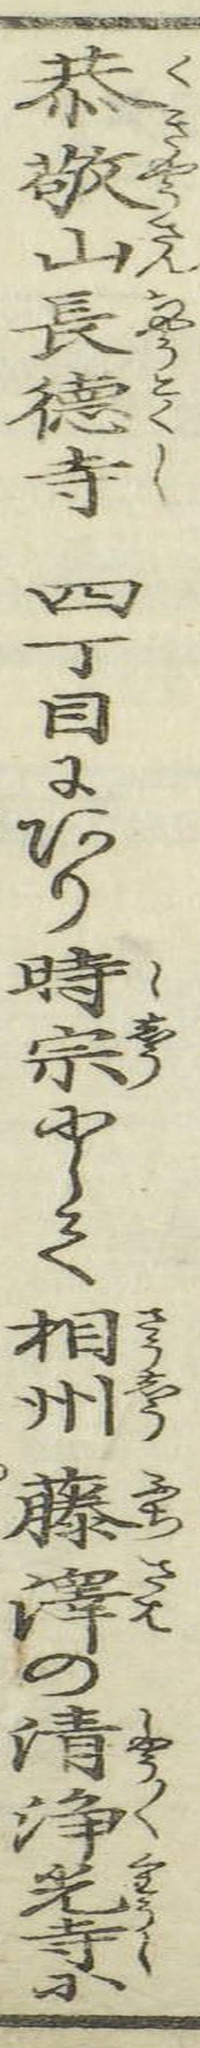恭敬山長德寺四丁目にあり時宗にして相州藤澤の清浄光寺に

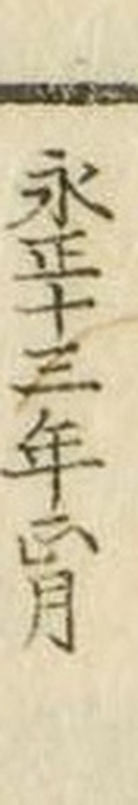永正十三年正月
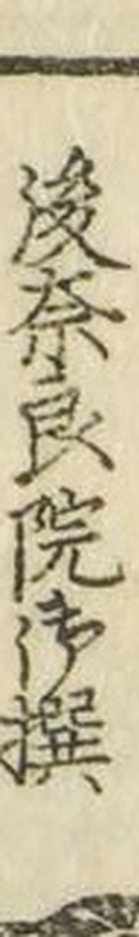後奈良院御撰
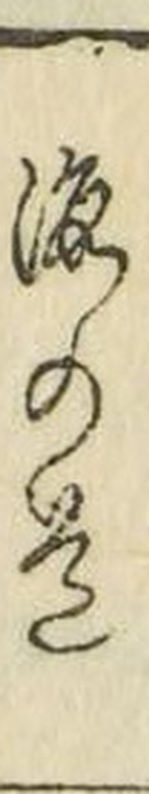海の道
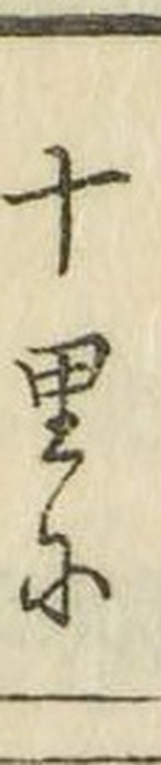十里に
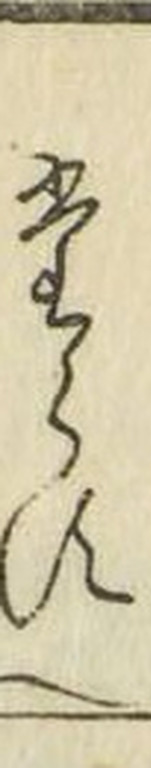たらす

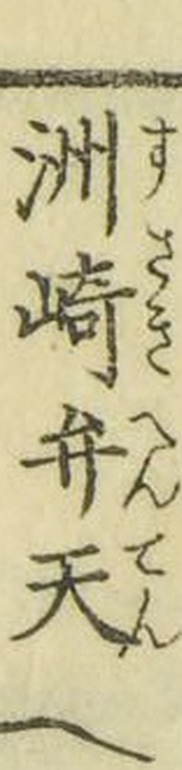洲崎弁天
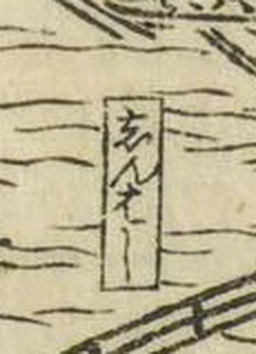しんはし
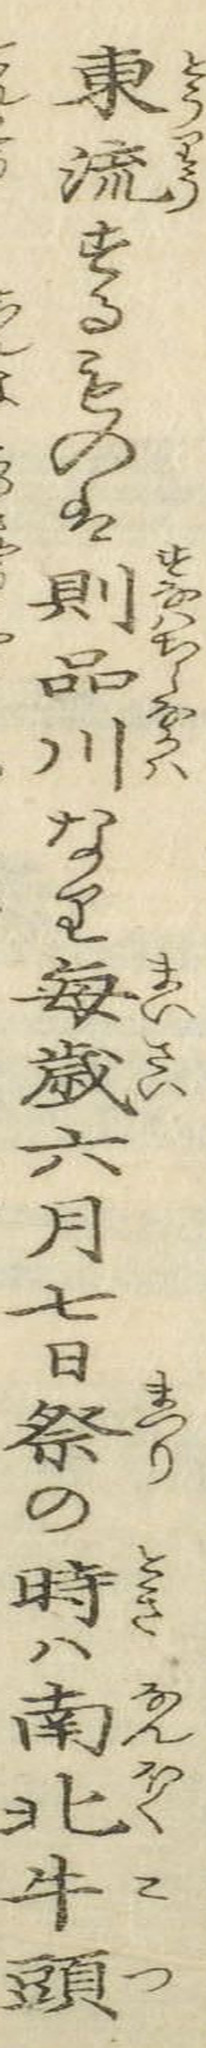東流するものは則品川なり毎歳六月七日祭の時は南北牛頭
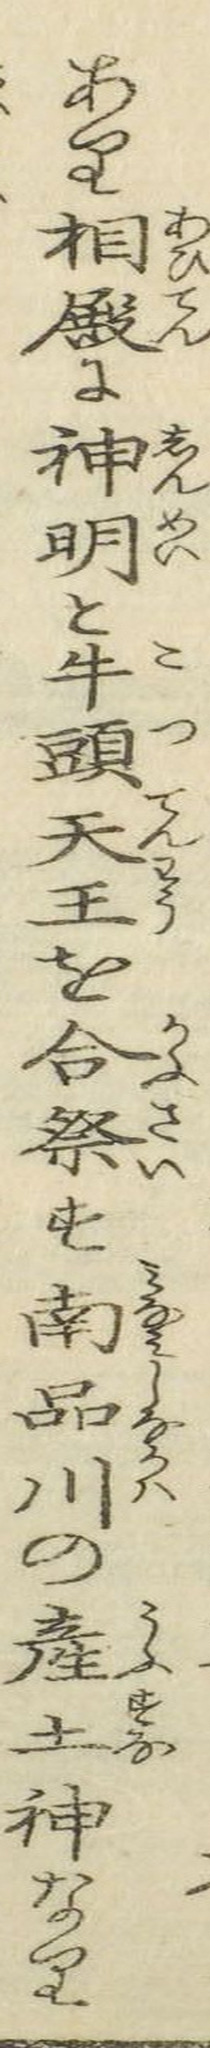あり相殿に神明と牛頭天王を合祭す南品川の産土神なり
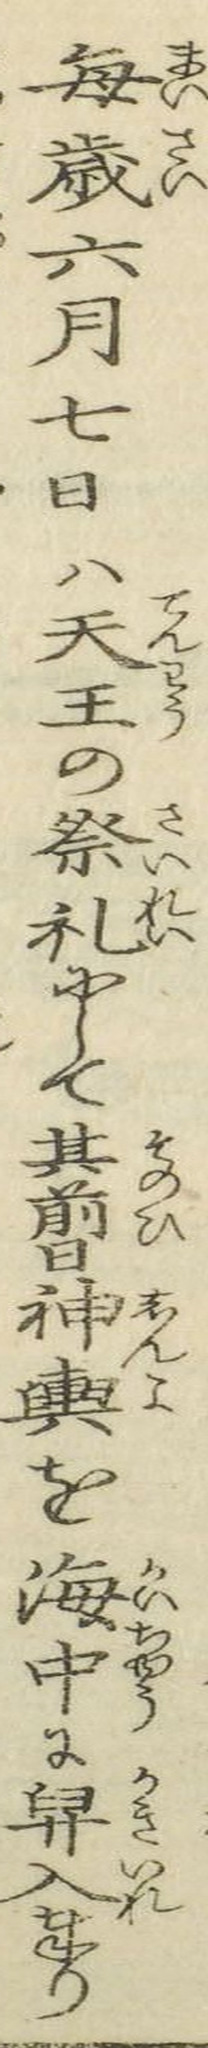毎歳六月七日は天王の祭礼にして其前日神輿を海中に舁入奉り
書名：江戸名所図会 20巻 巻之4
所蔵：東京学芸大学教育コンテンツアーカイブ
